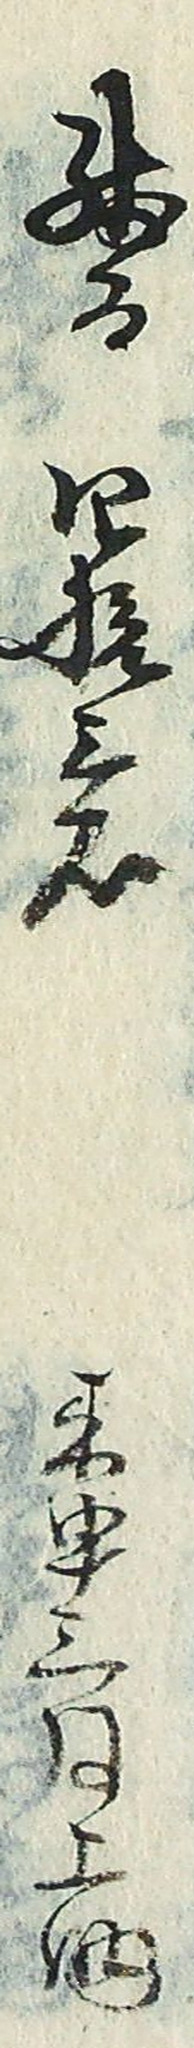残而四拾三石来申三月上納
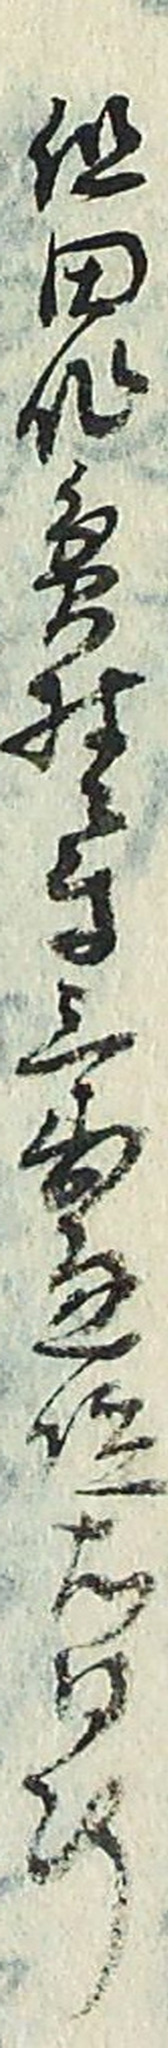但田作貧村ニ付三歩通位右同断
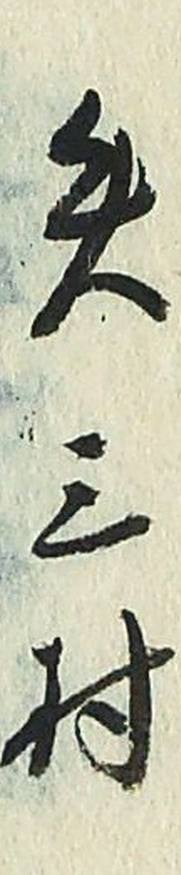矢三村
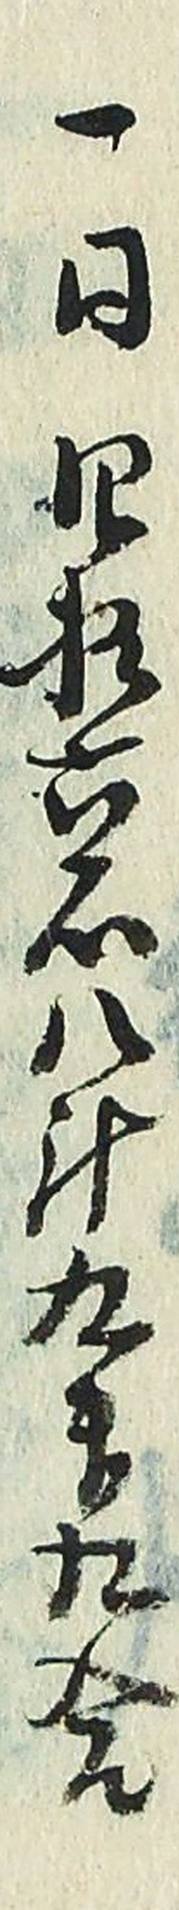一同四拾六石八斗九升九合
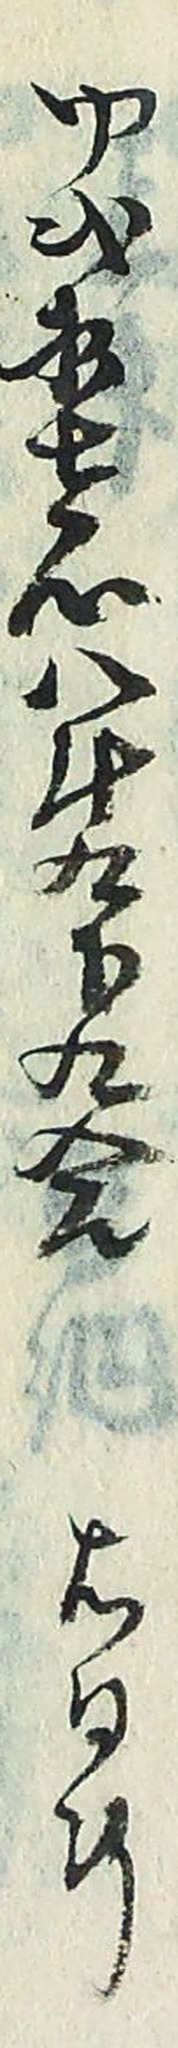内弐拾七石八斗九升九合右同断
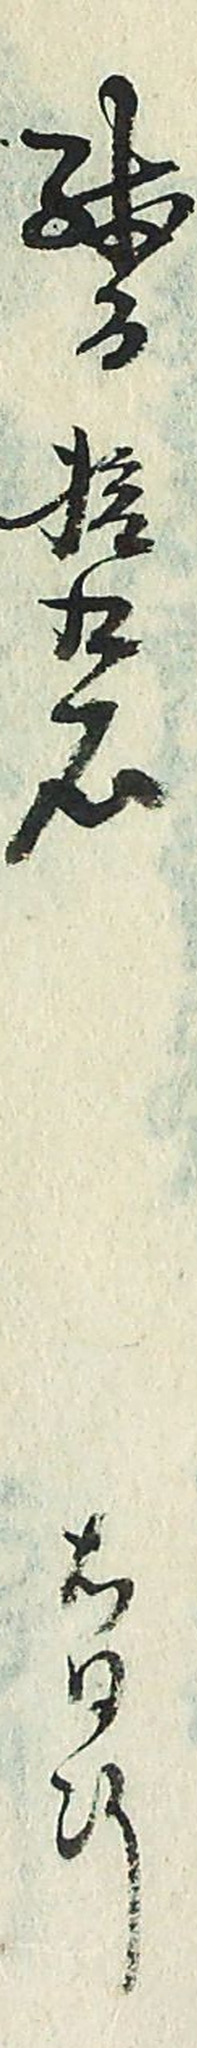残而拾九石右同断
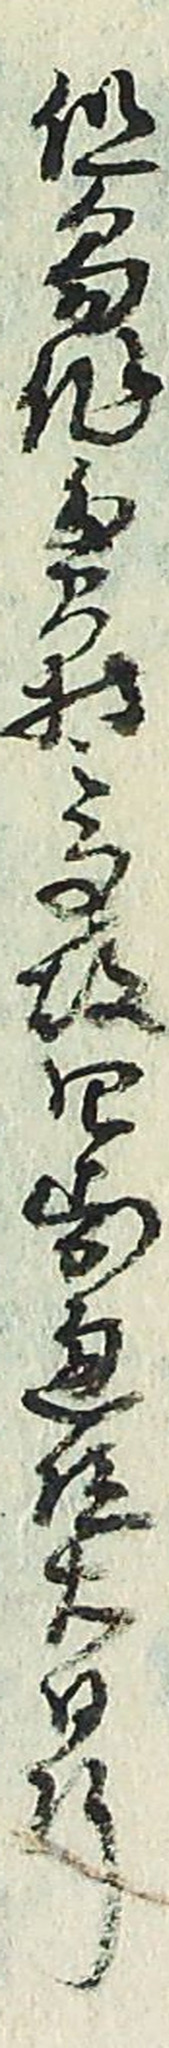但畠作貧村之事故四歩通位右同断
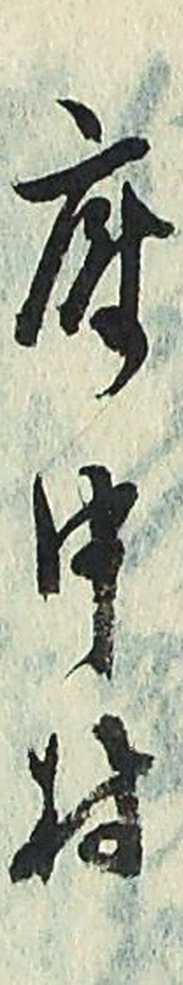府中村
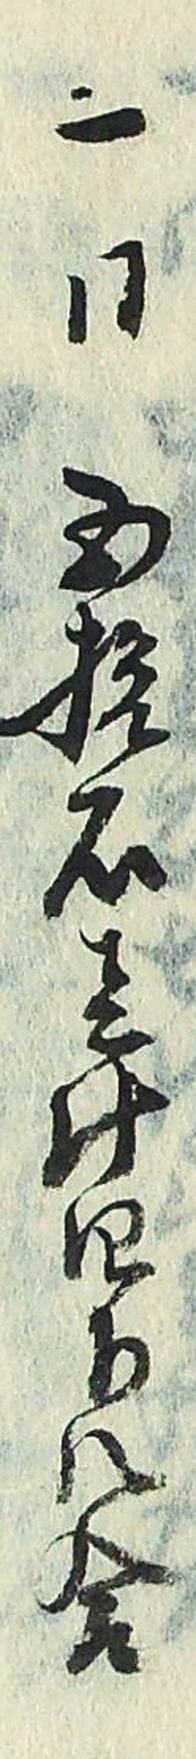一同五拾石壱斗四升八合
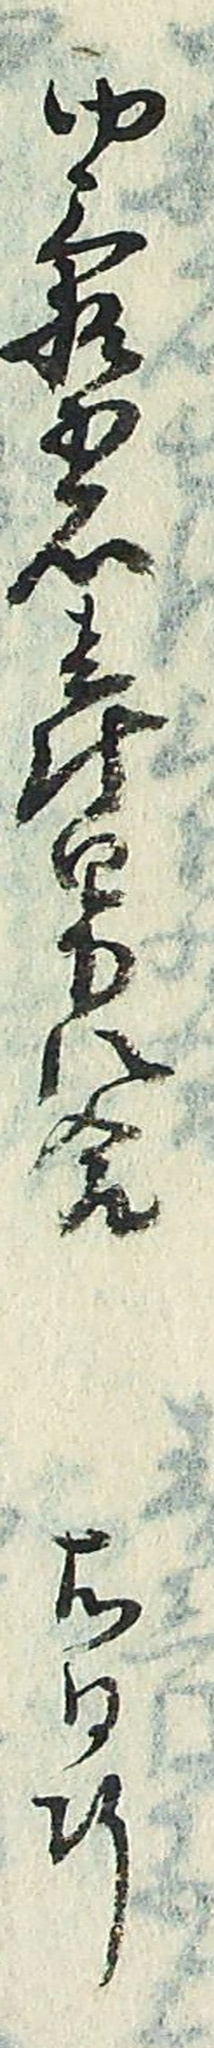内三拾五石壱斗四升八合右同断
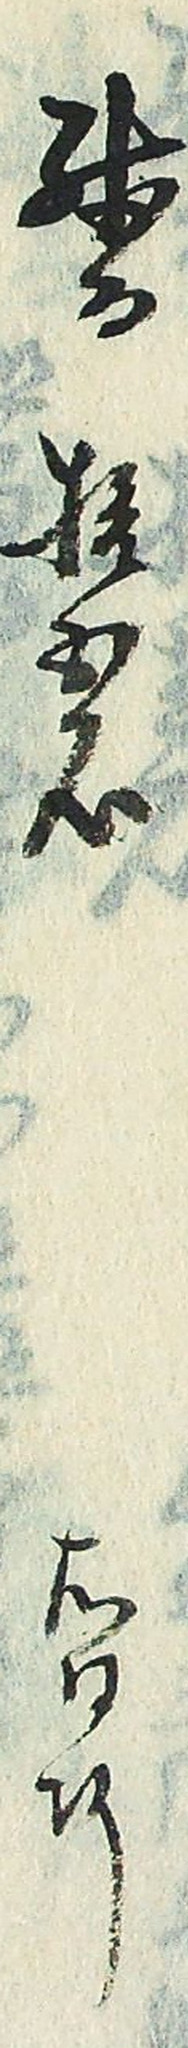残而拾五石右同断
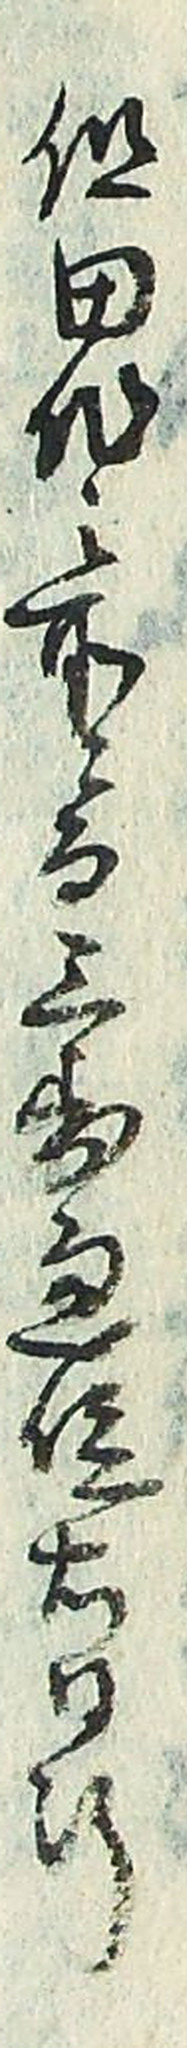但田作之所ニ而三歩通位右同断

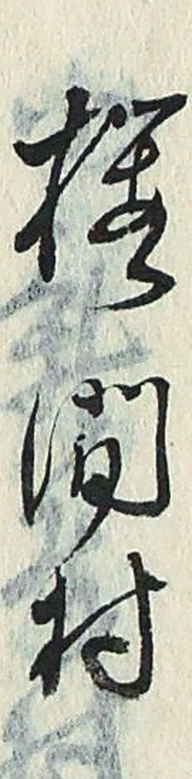桜間村
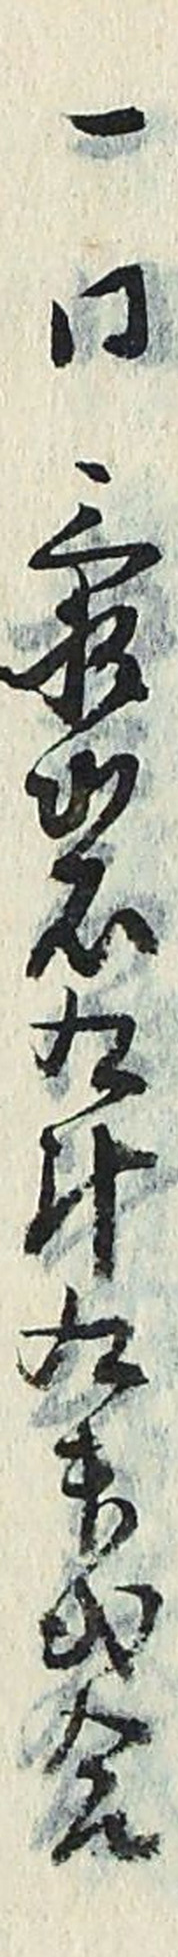一同三拾弐石九斗九升弐合
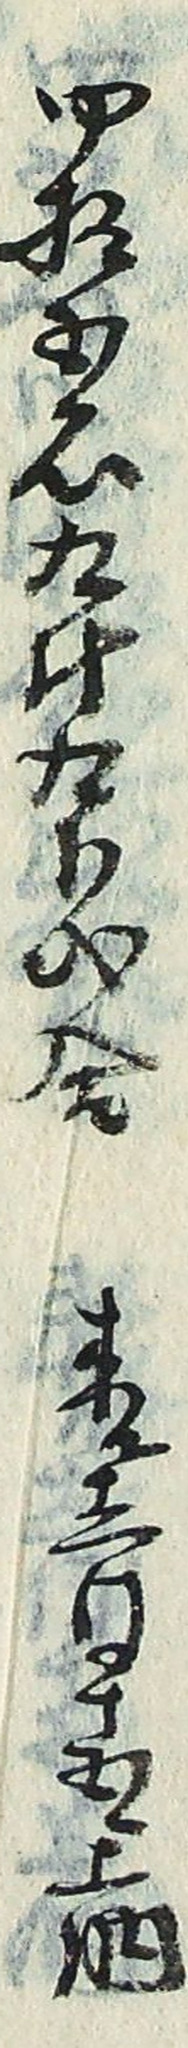内拾五石九斗九升弐合来ル十二月十五日上納
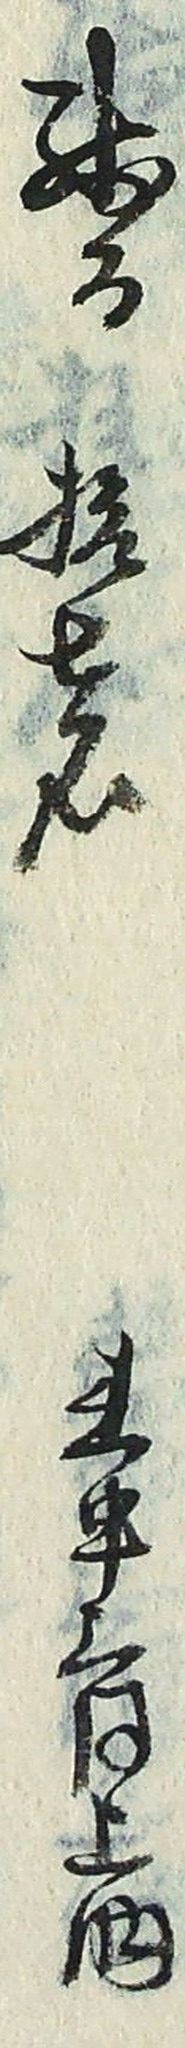残而拾七石来申三月上納
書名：諸御趣意書并御下知向之写
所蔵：鳴門教育大学 Naruto University of Education
